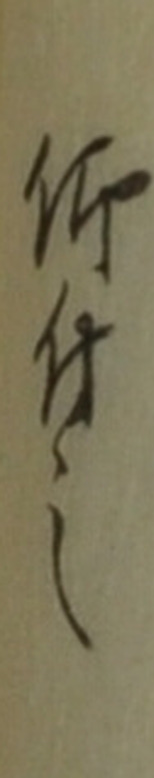仰付之
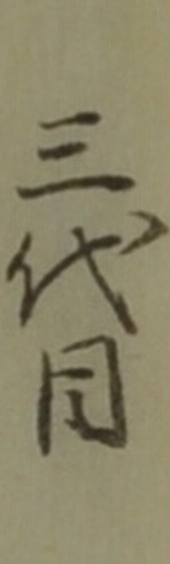三代目
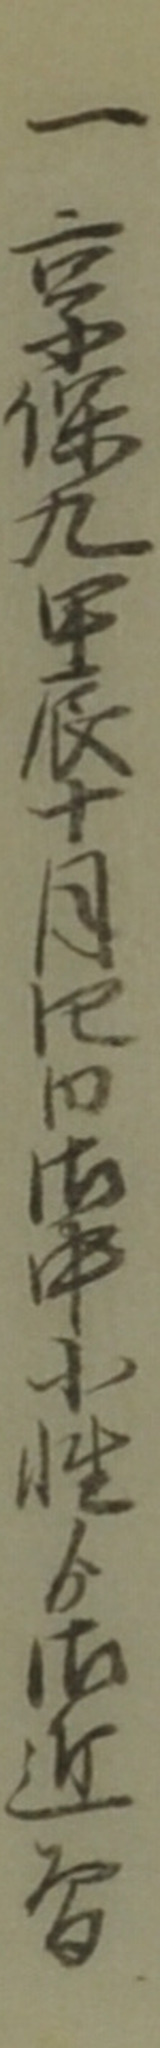一享保九甲辰十月四日御中小性ゟ御近習
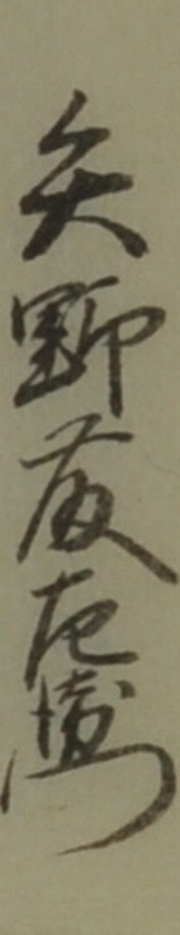矢野藤左衛門
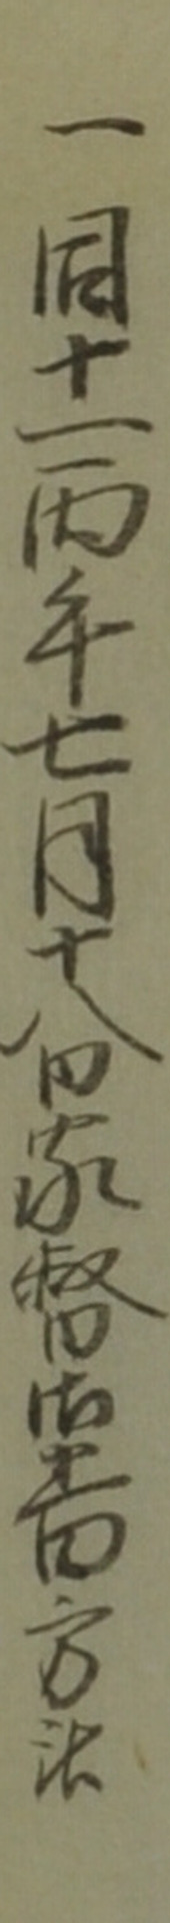一同十一丙午七月十八日家督御番方被
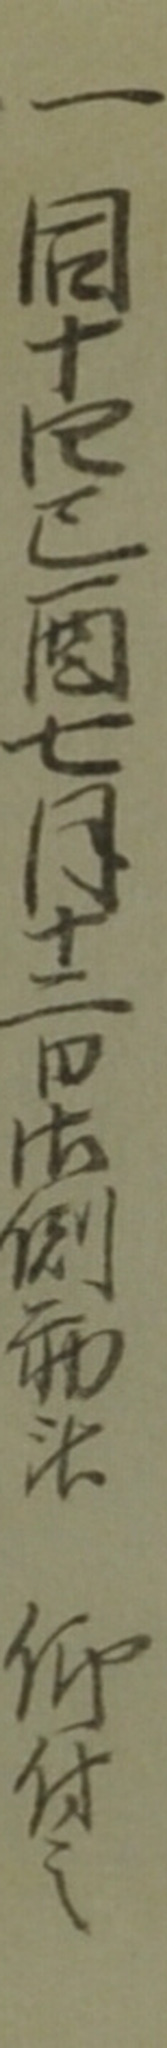一同十四己酉七月十二日御側勤被仰付之
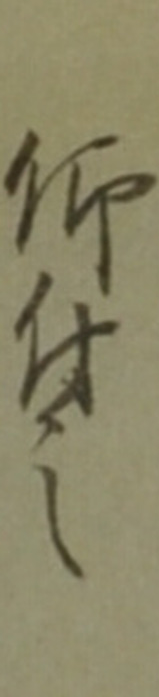仰付之
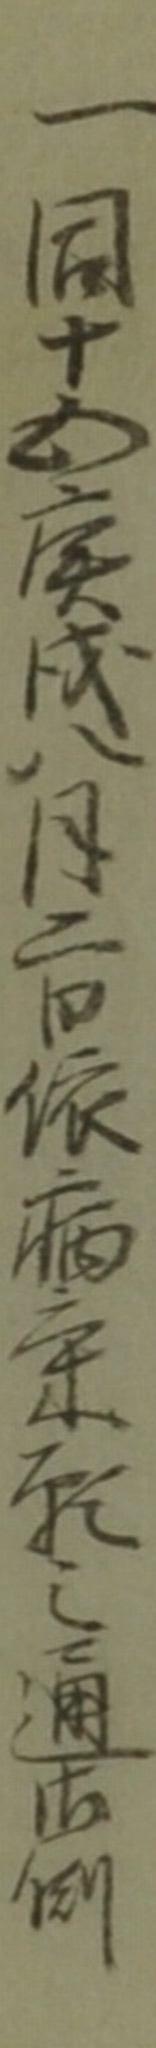一同十五庚戌八月二日依病気願之通御側
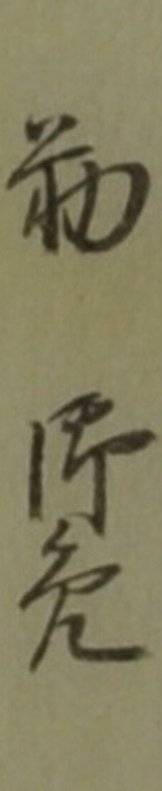勤御免
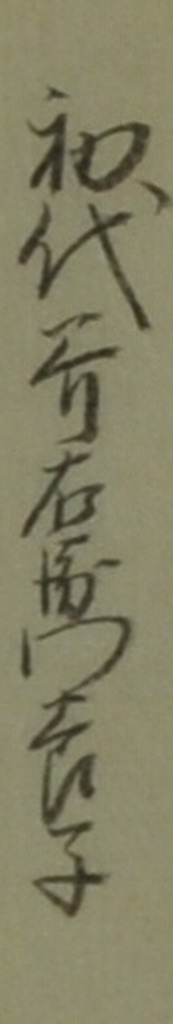初代斧右衛門養子
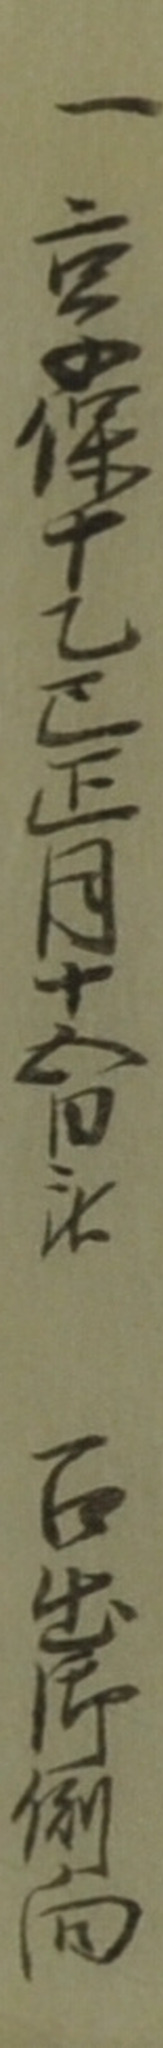一享保十乙巳正月十五日被召出御側向
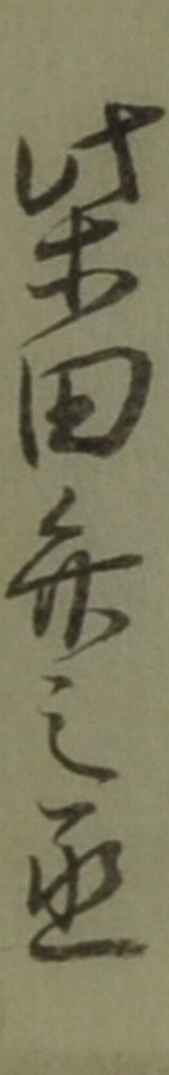柴田弁之丞
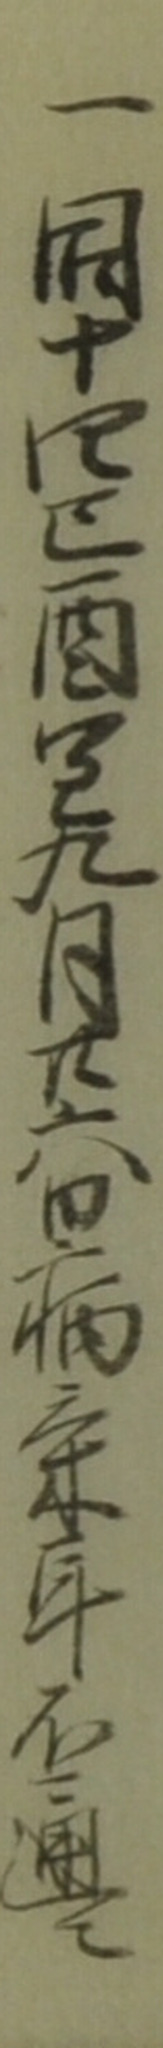一同十四己酉閏九月廿六日病気耳不通ニ
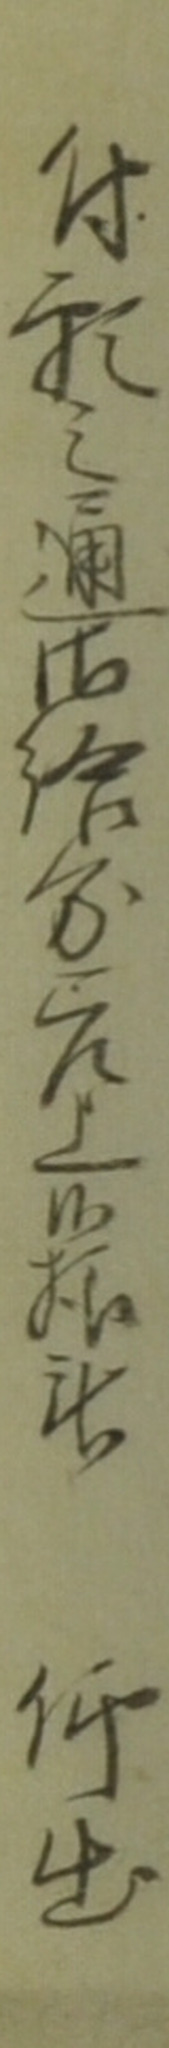付願之通御給分差上候様被仰出
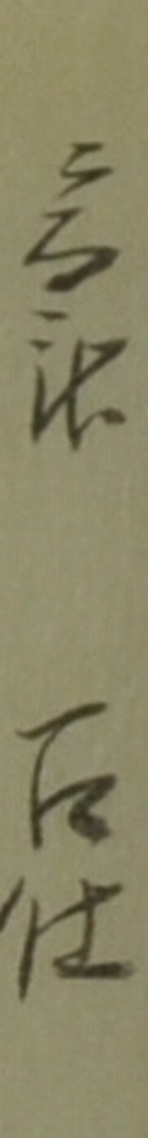ニ而被召仕

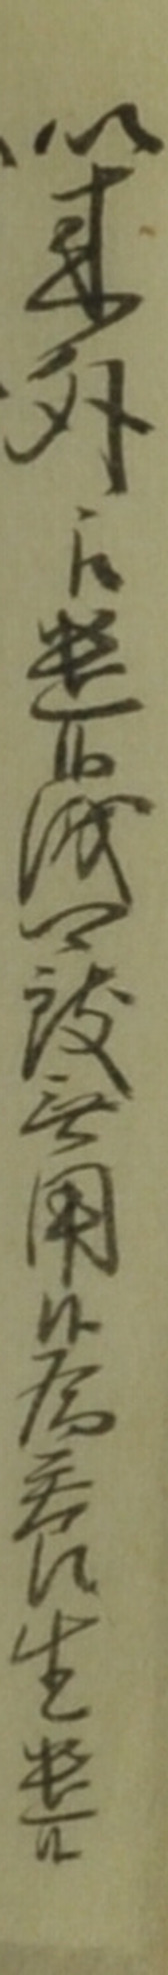以来外江遣候儀可致無用候為養生遣候
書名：諸御役代々録（五）
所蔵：伊那市立高遠町図書館・合同会社AMANE
